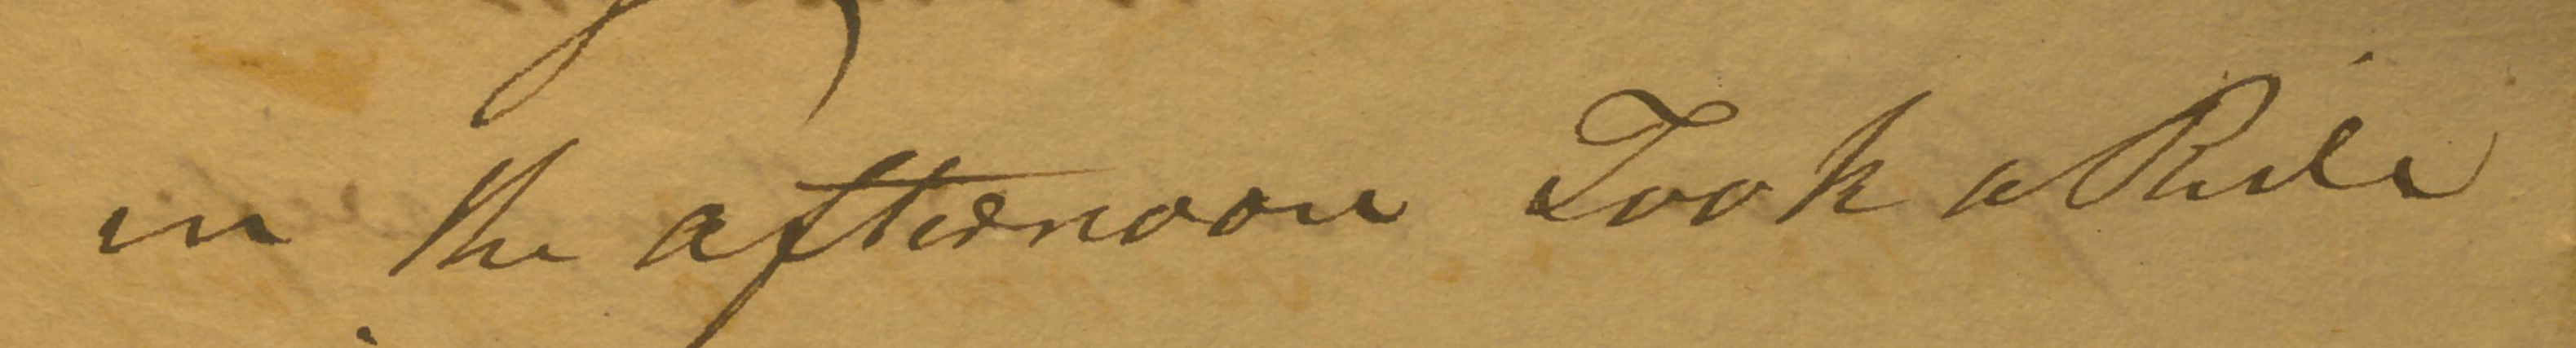in the afternoon Took a Ride
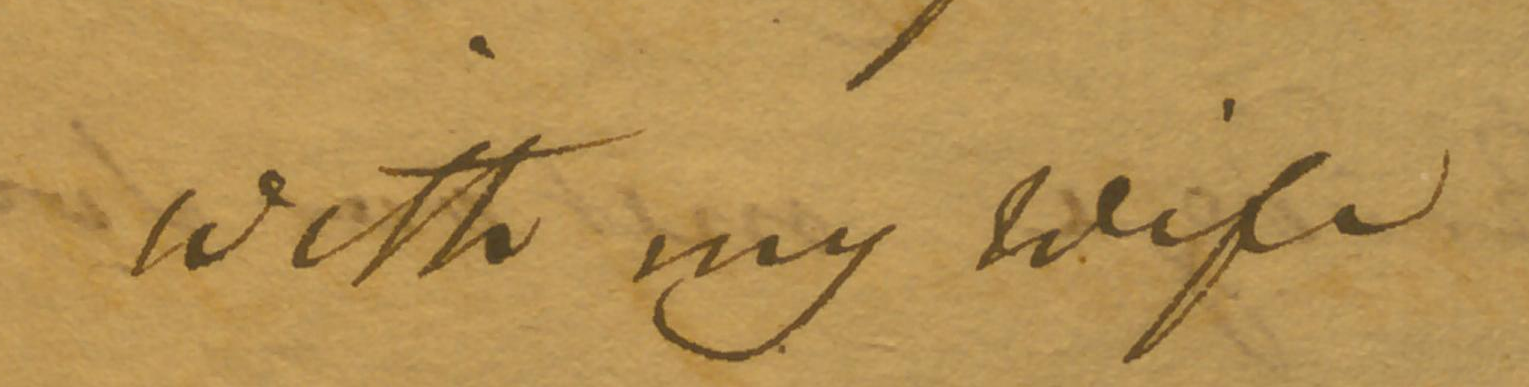with my wife
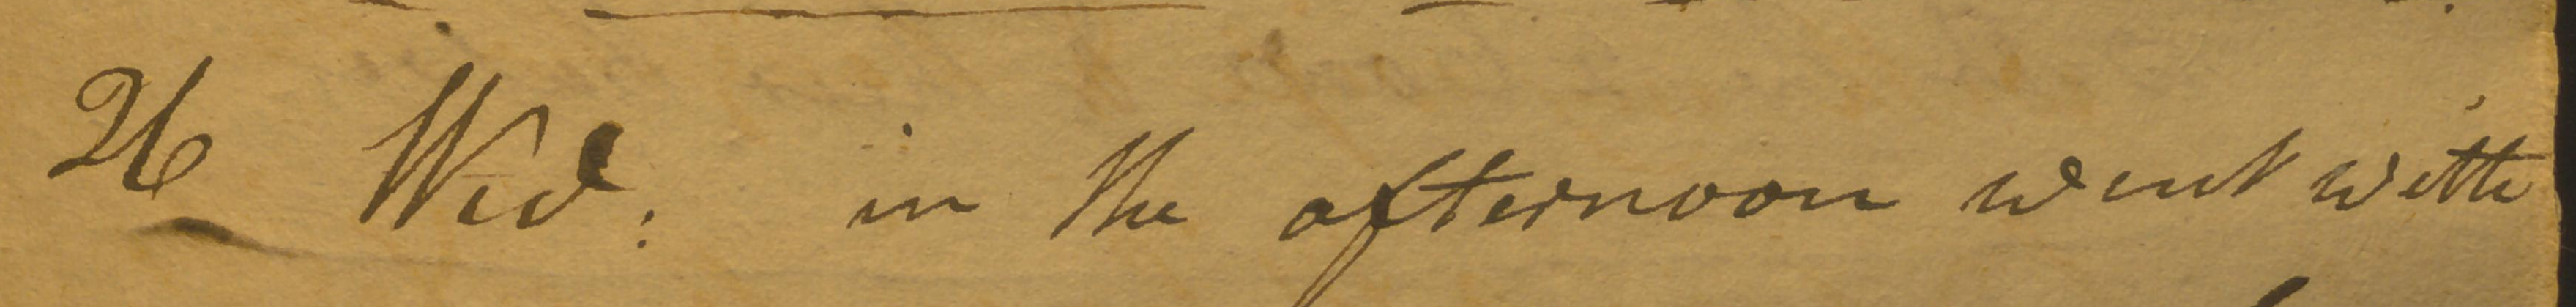26 Wed. in the afternoon went with
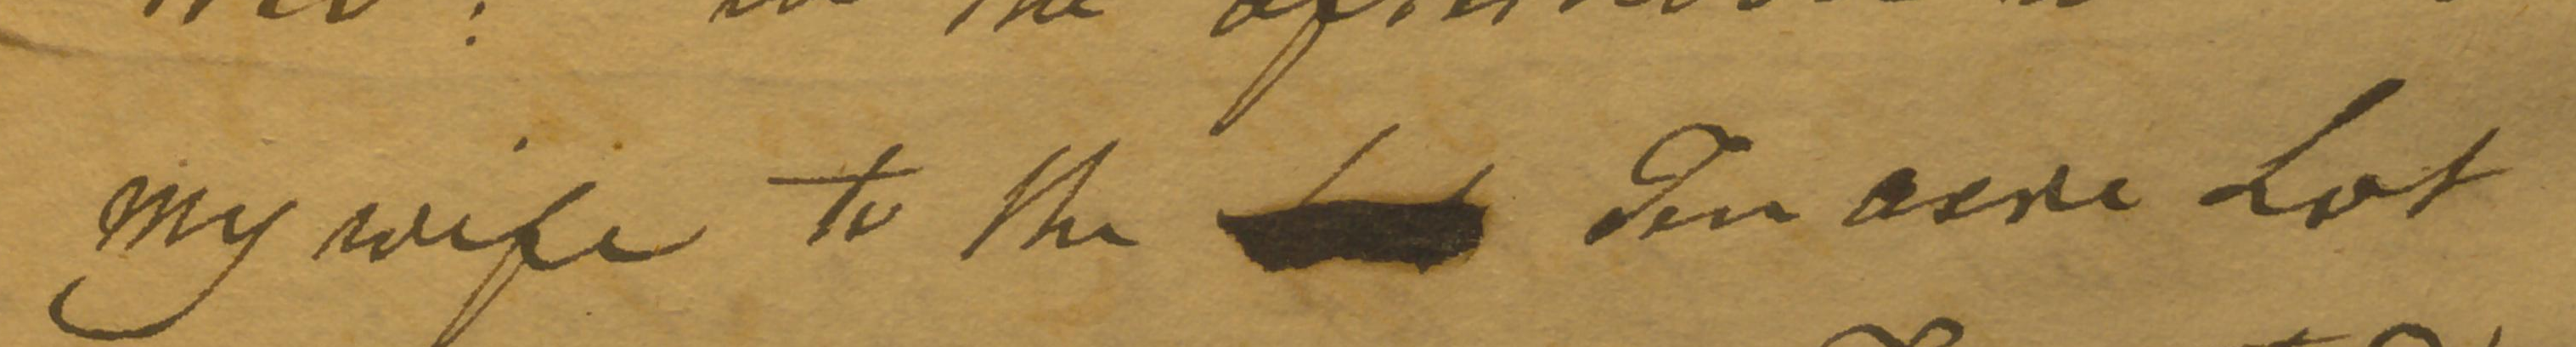my wige to the [Lot] Ten acre Lot
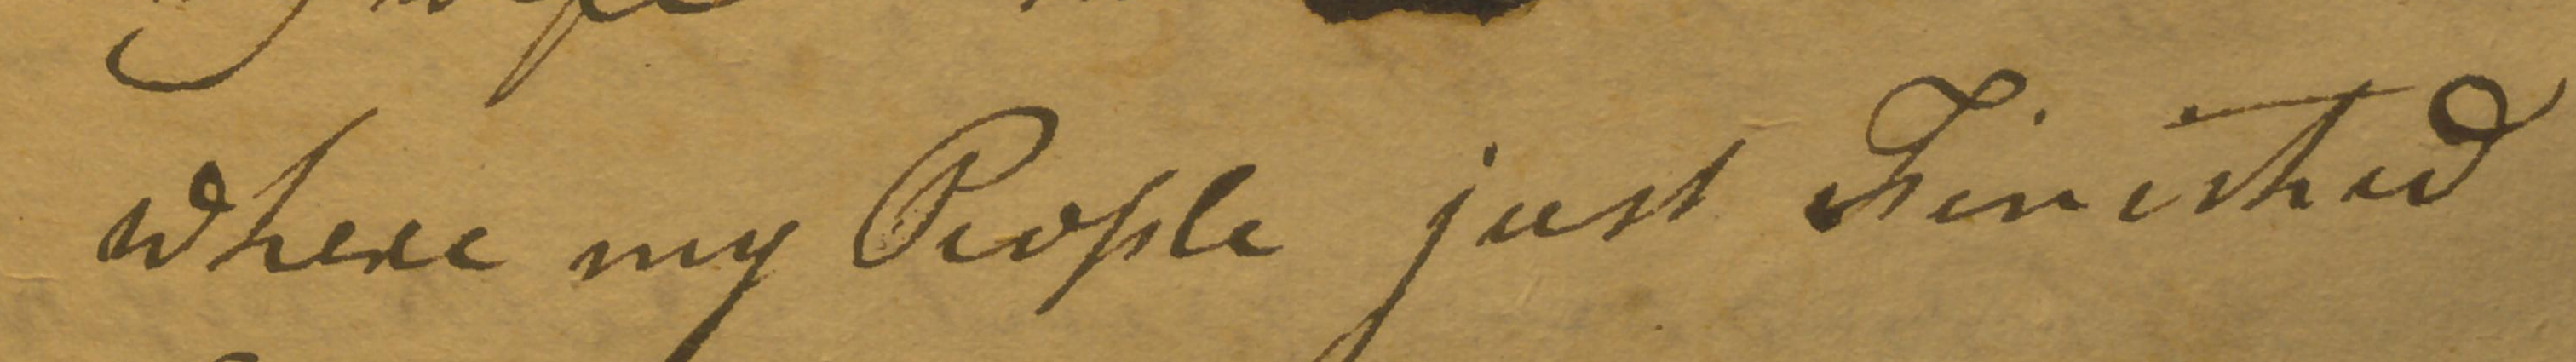where my People just Finished
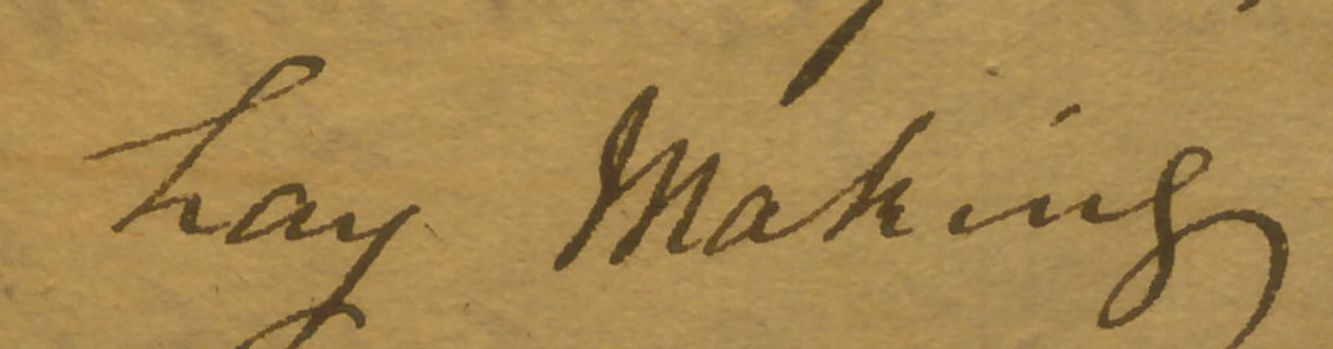hay Making
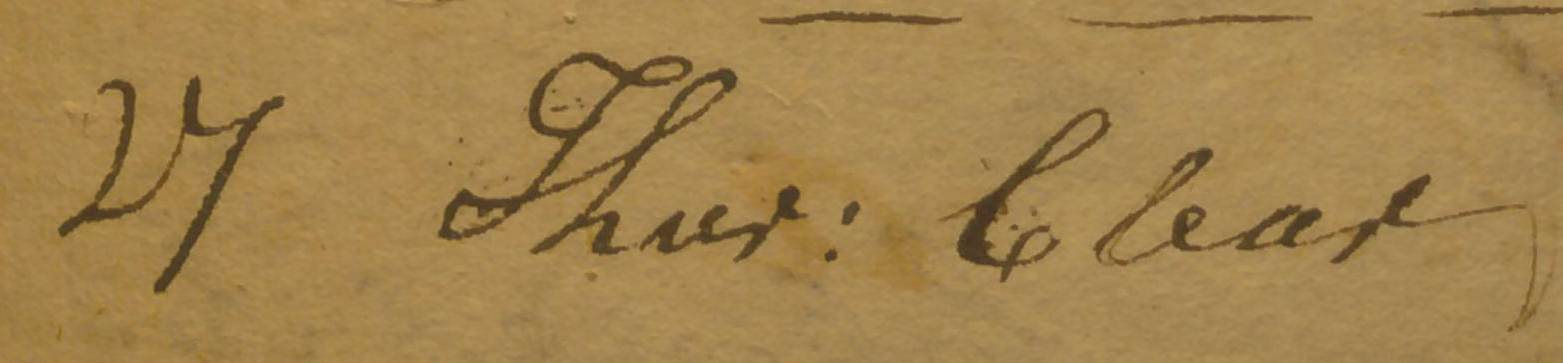27 Thur: Clear
